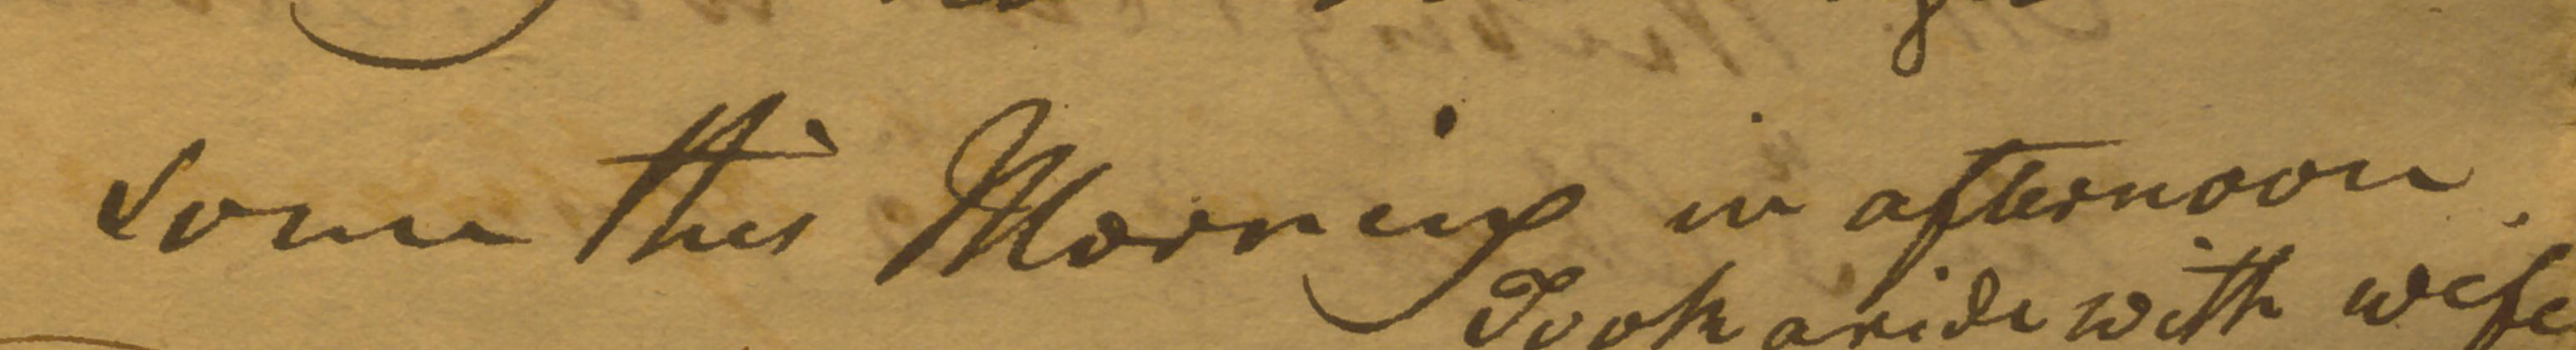some this Morning in afternoon
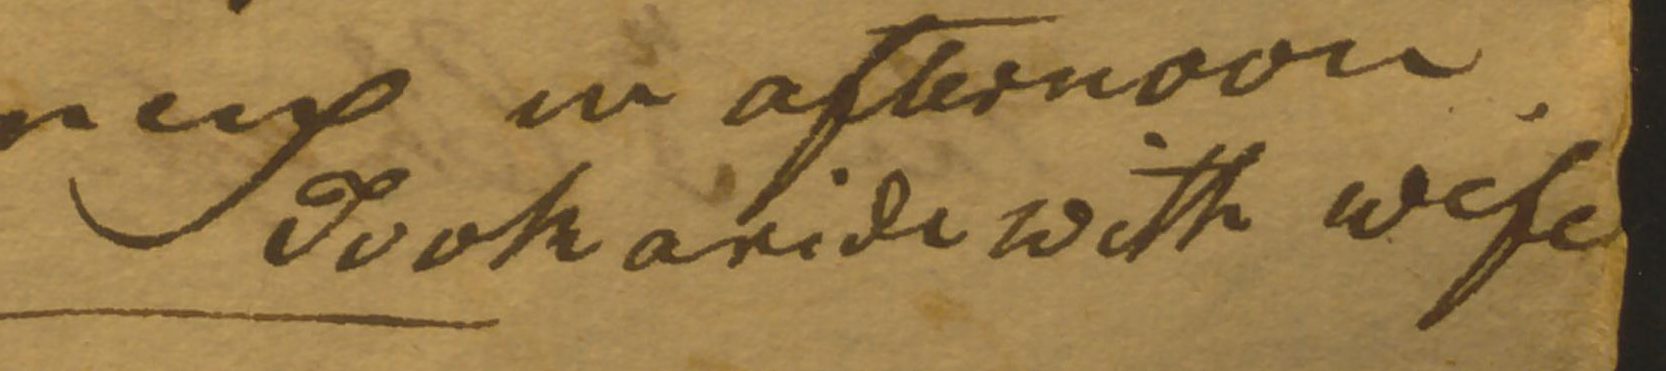Took a ride with wife
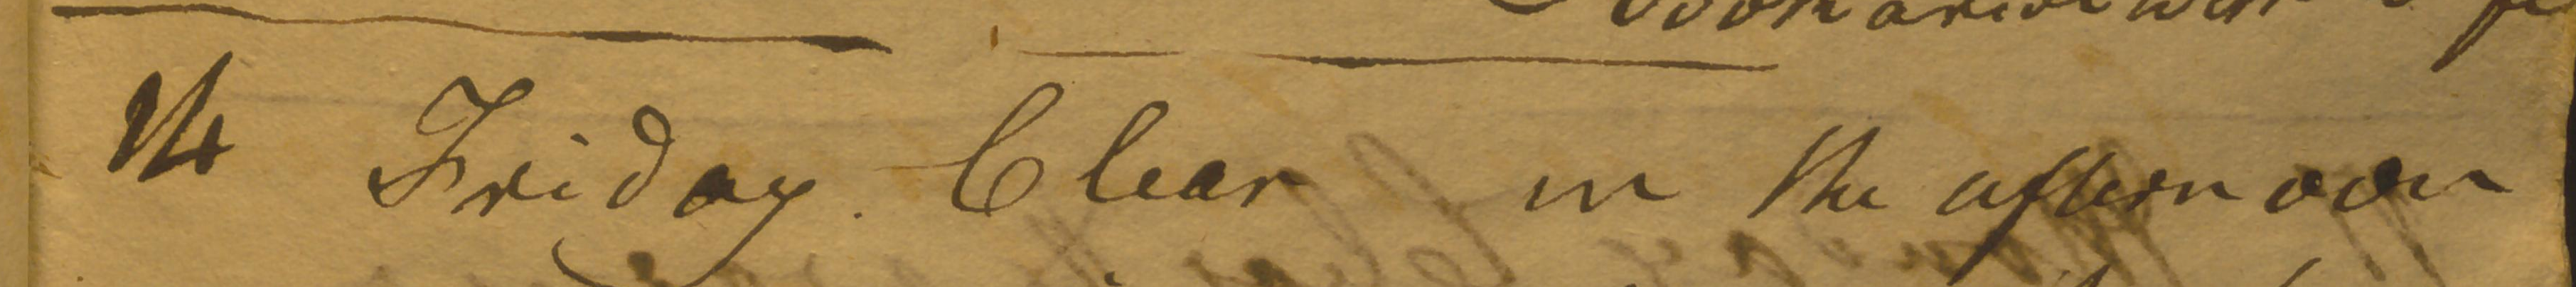14 Friday Clear, in the afternoon
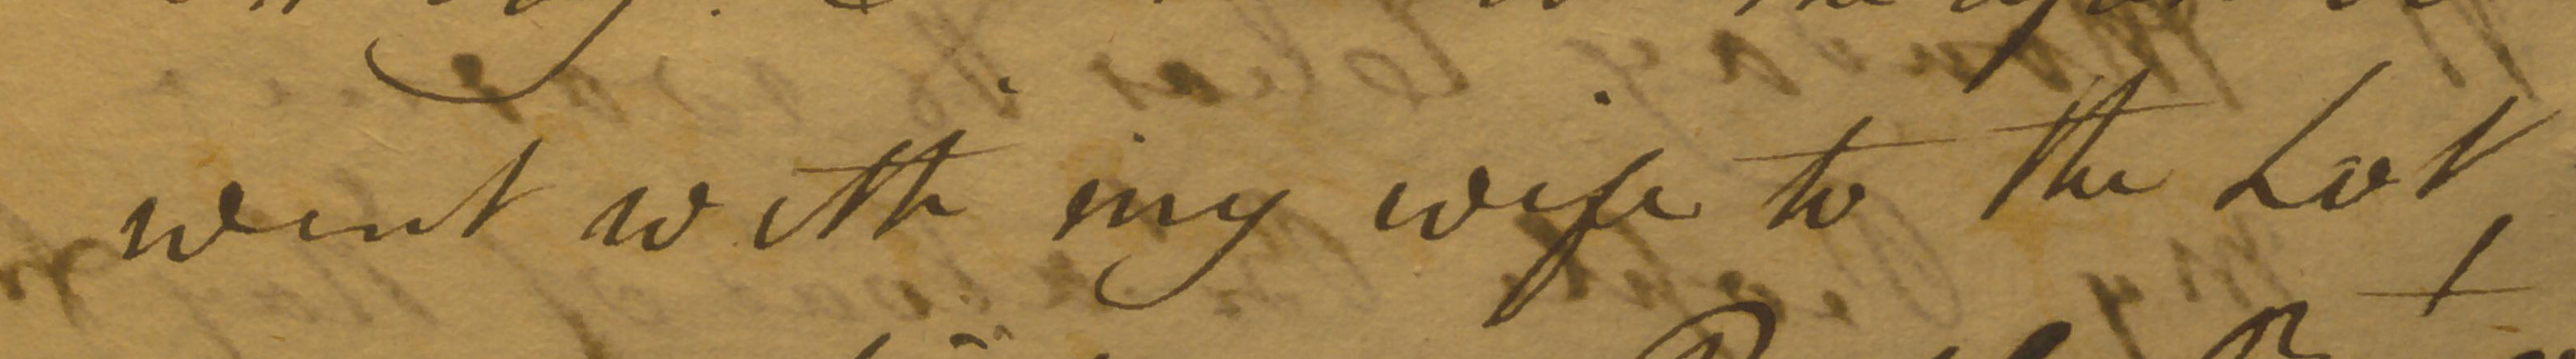went with my wife to the Lot
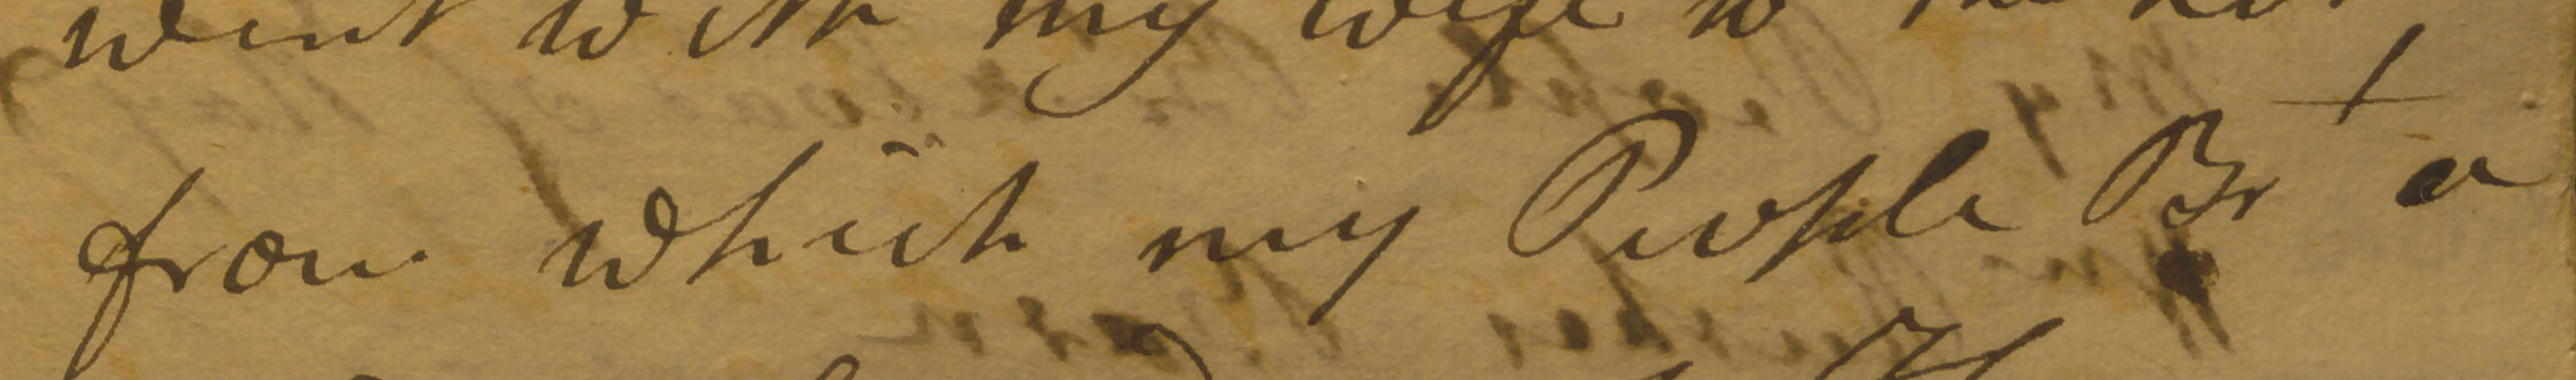fron which my People Br^t a
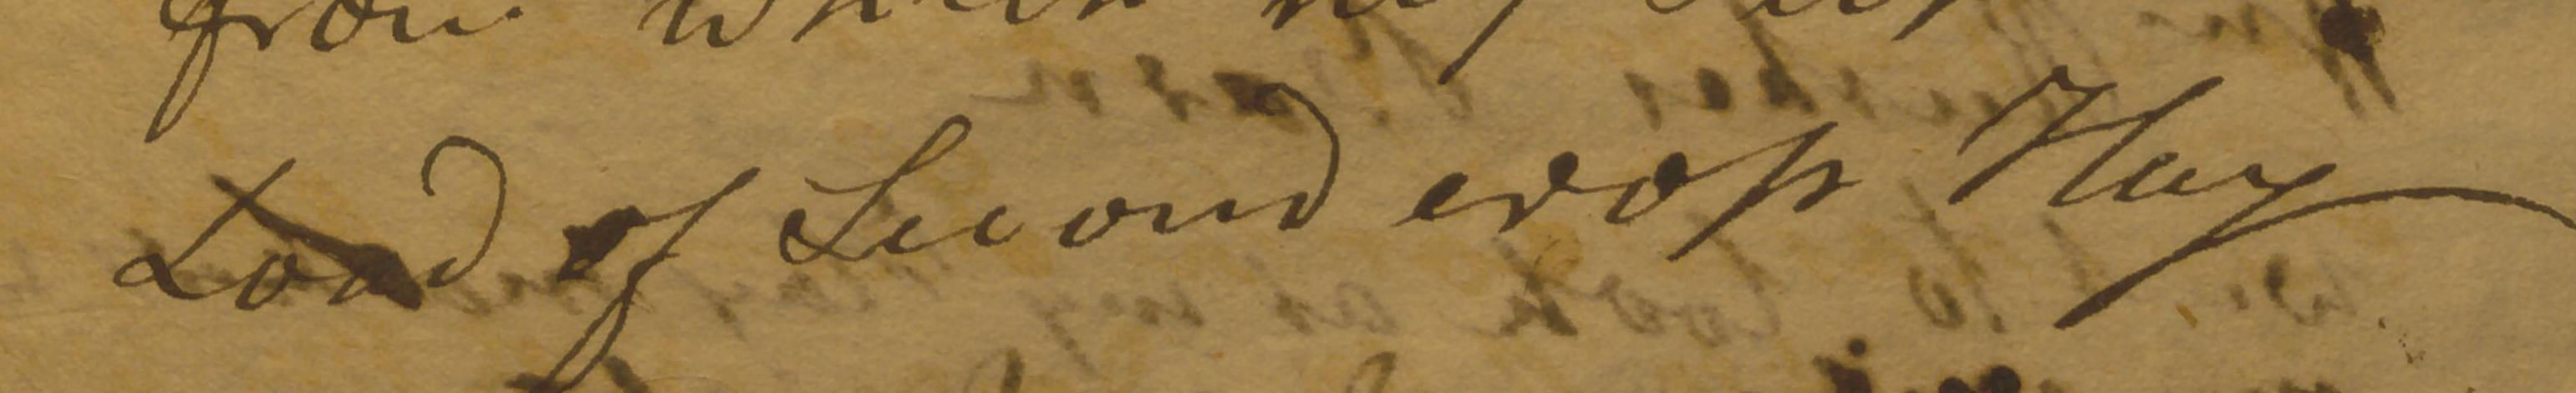Load of second crop Hay
